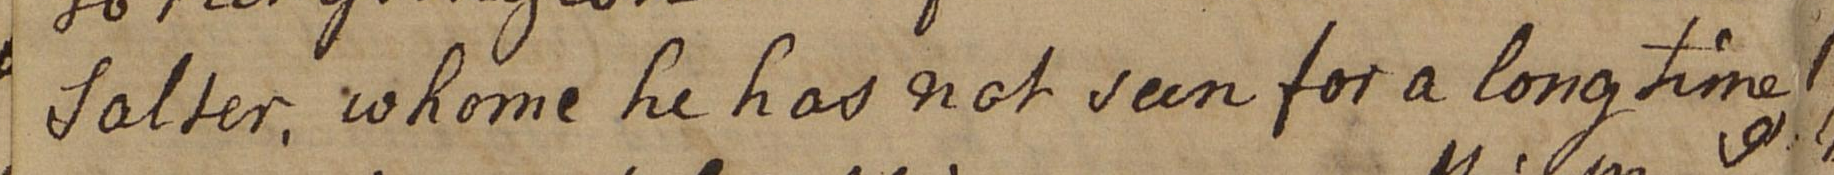Salter, whome he has not seen for a long time
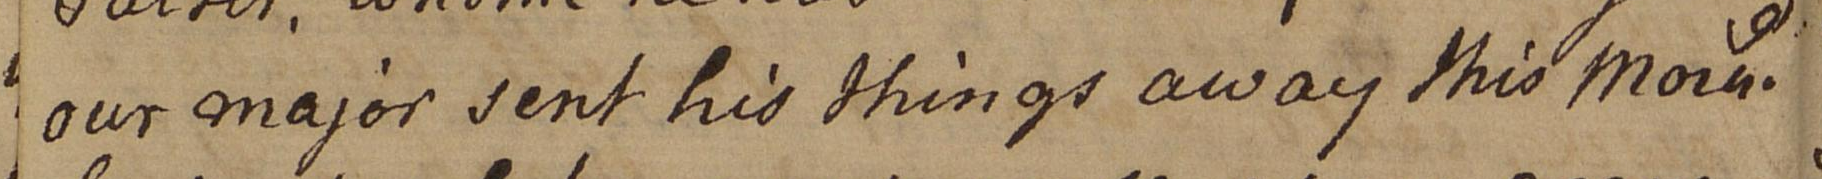our major sent his things away this Morn^g.
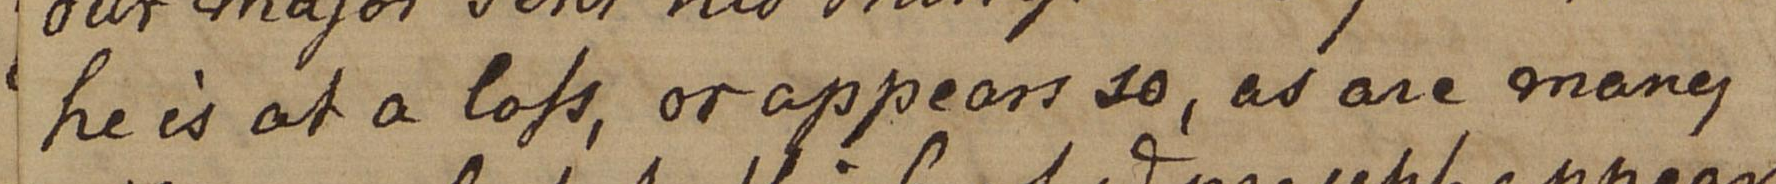he is at a loss, or appears so, as are many
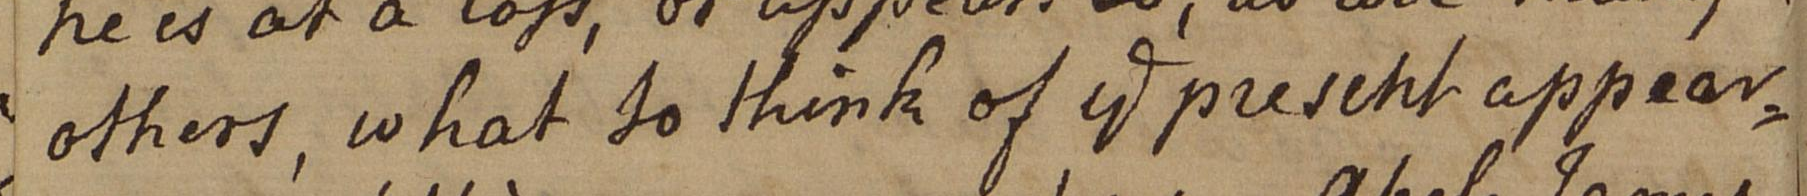others, what to think of y^e present appear-
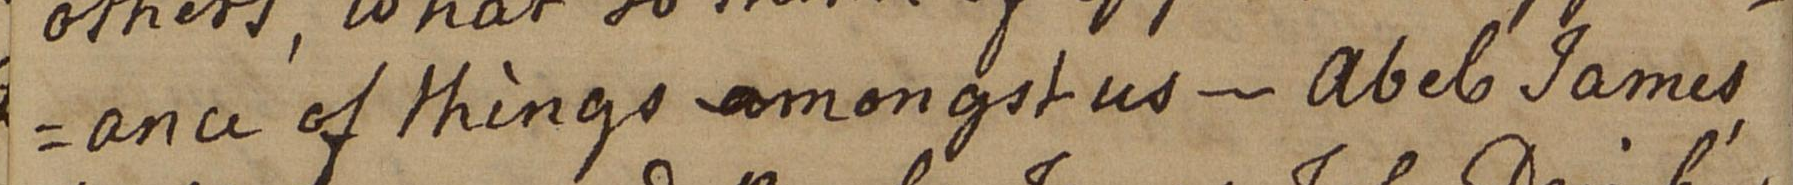-ance of things amongst us- Abel James,
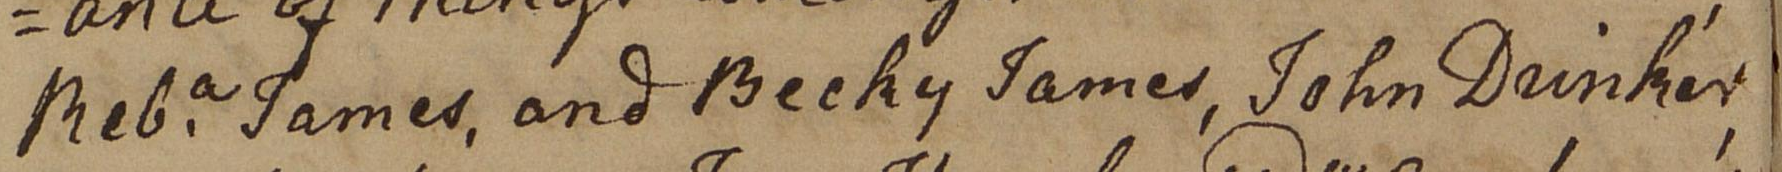Reb^a. James, and Becky James, John Drinker,
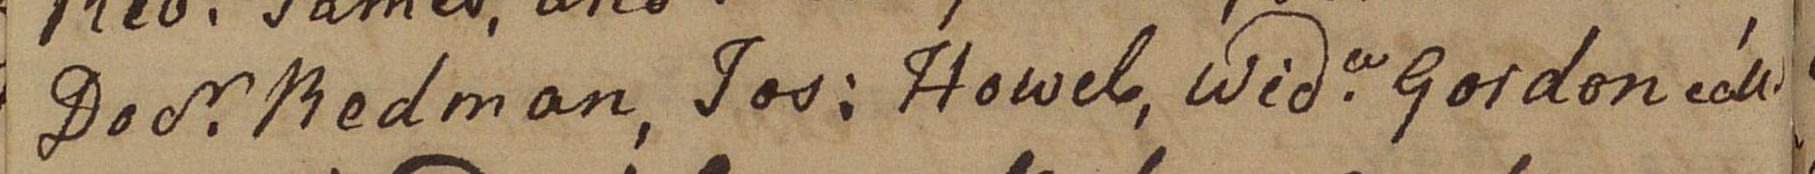Doc^r. Redman, Jos: Howel, Wid^w. Gordon calld
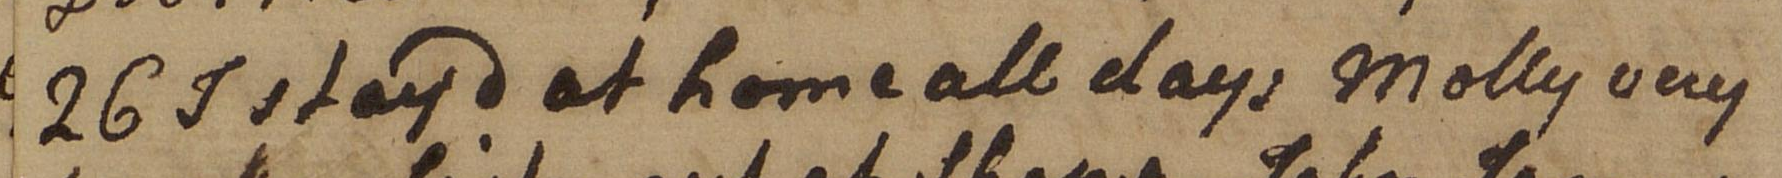26 I stay'd at home all day: Molly very
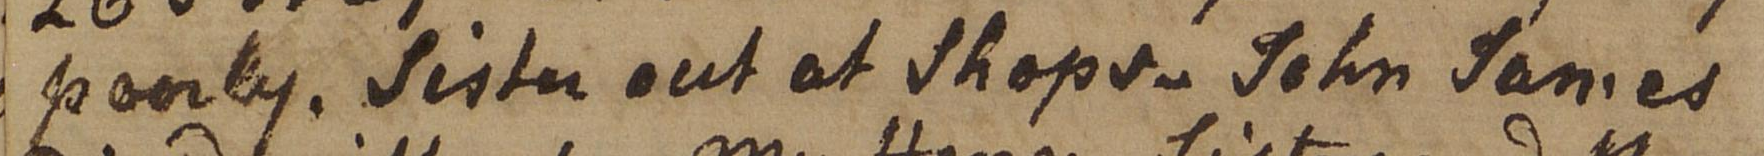poorly, Sister out at Shops- John James
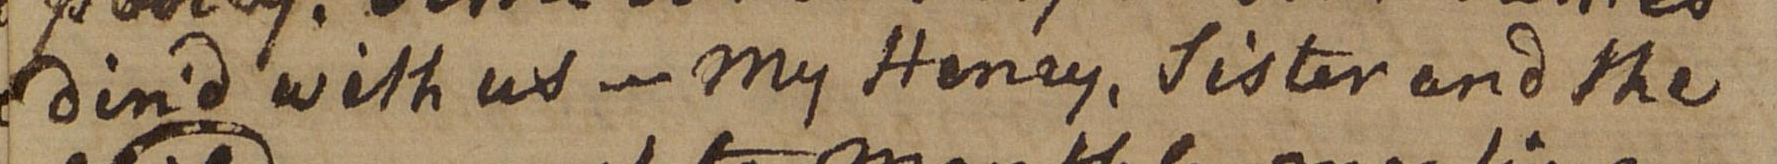din'd with us- my Henry, Sister and the
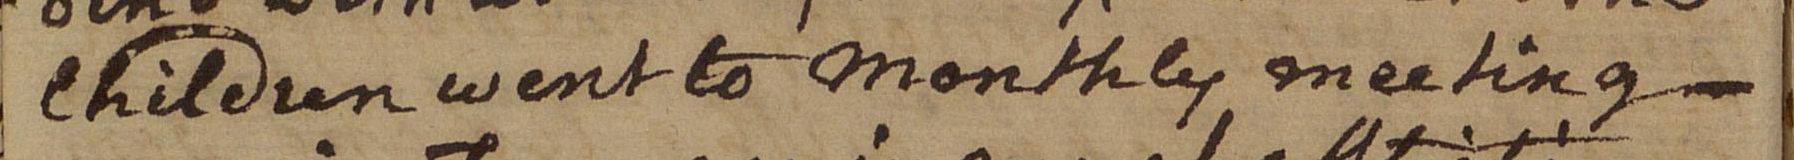Children went to monthly meeting-
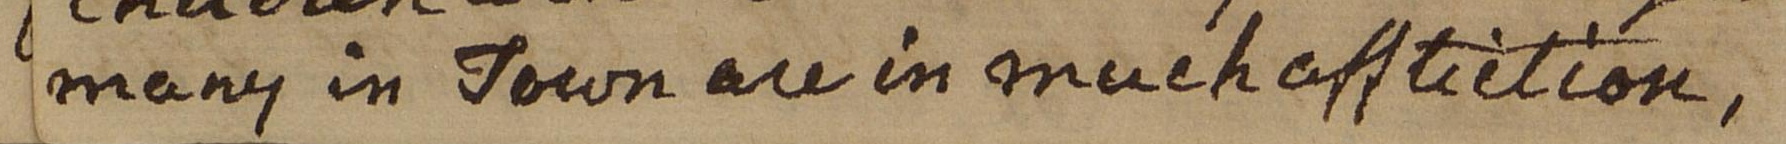many in Town are in much afftiction,
